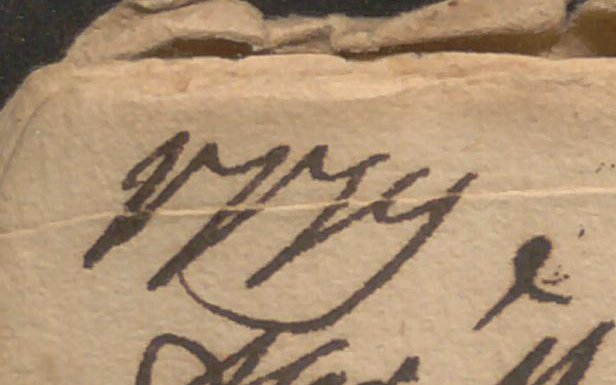1779
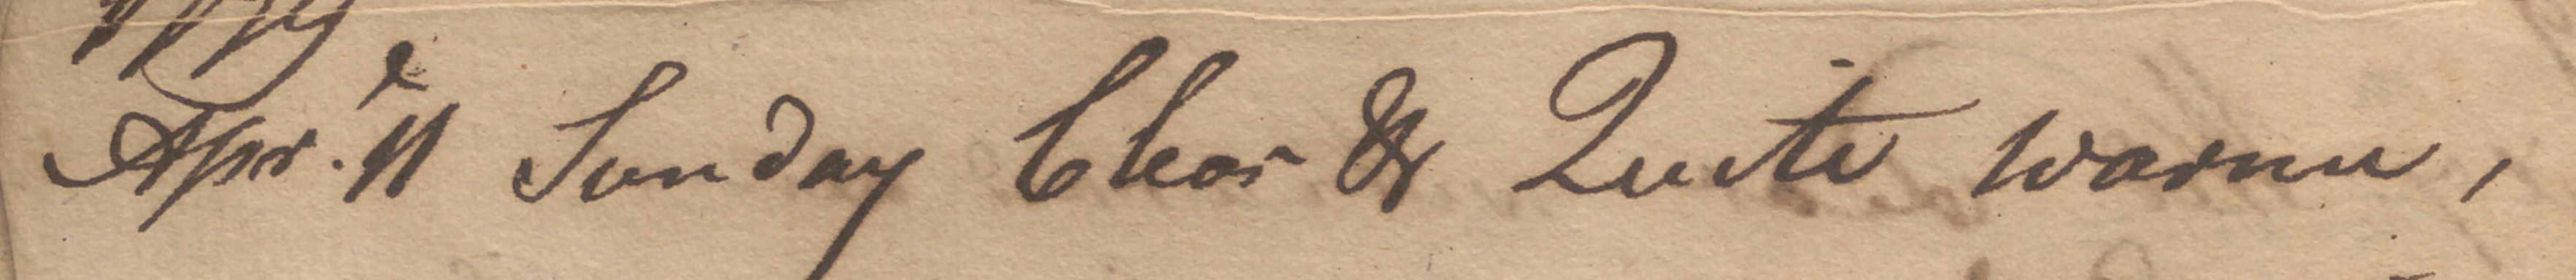Apr^l. 11 Sunday Clear & Quite warme,
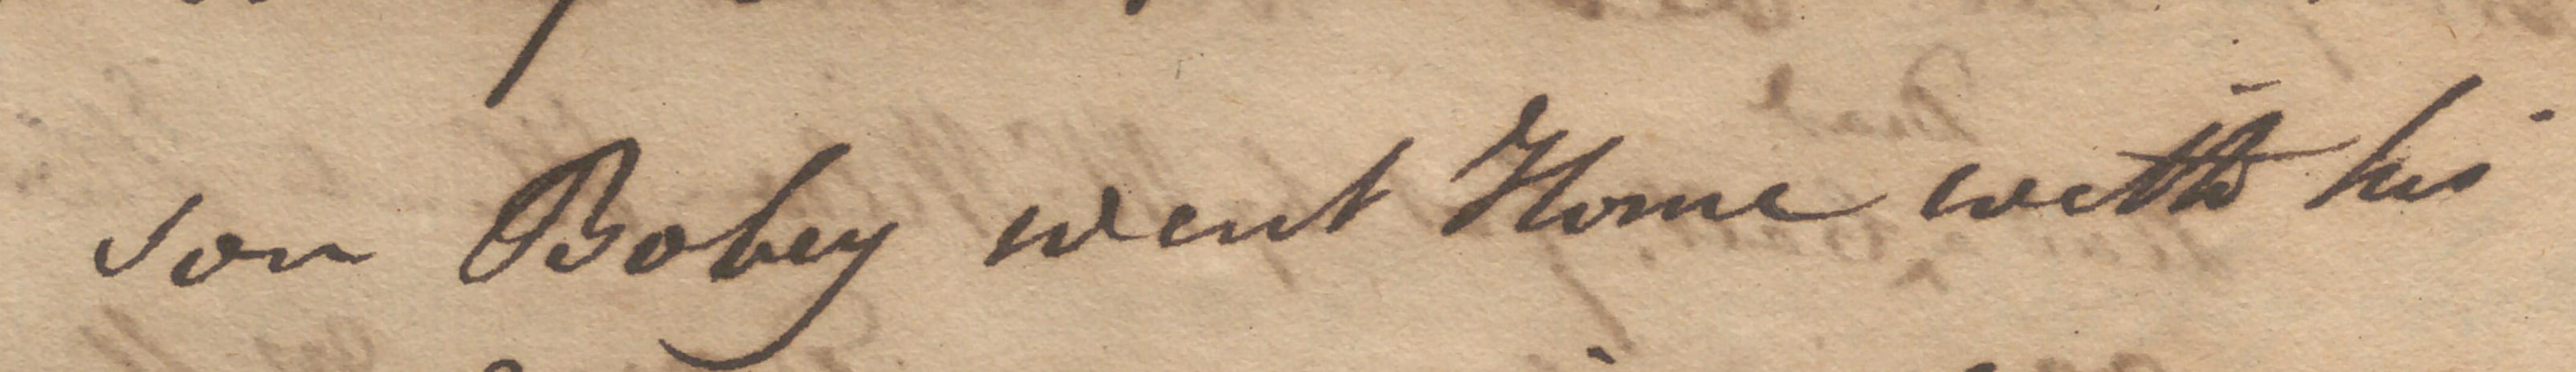son Bobey went Home with his
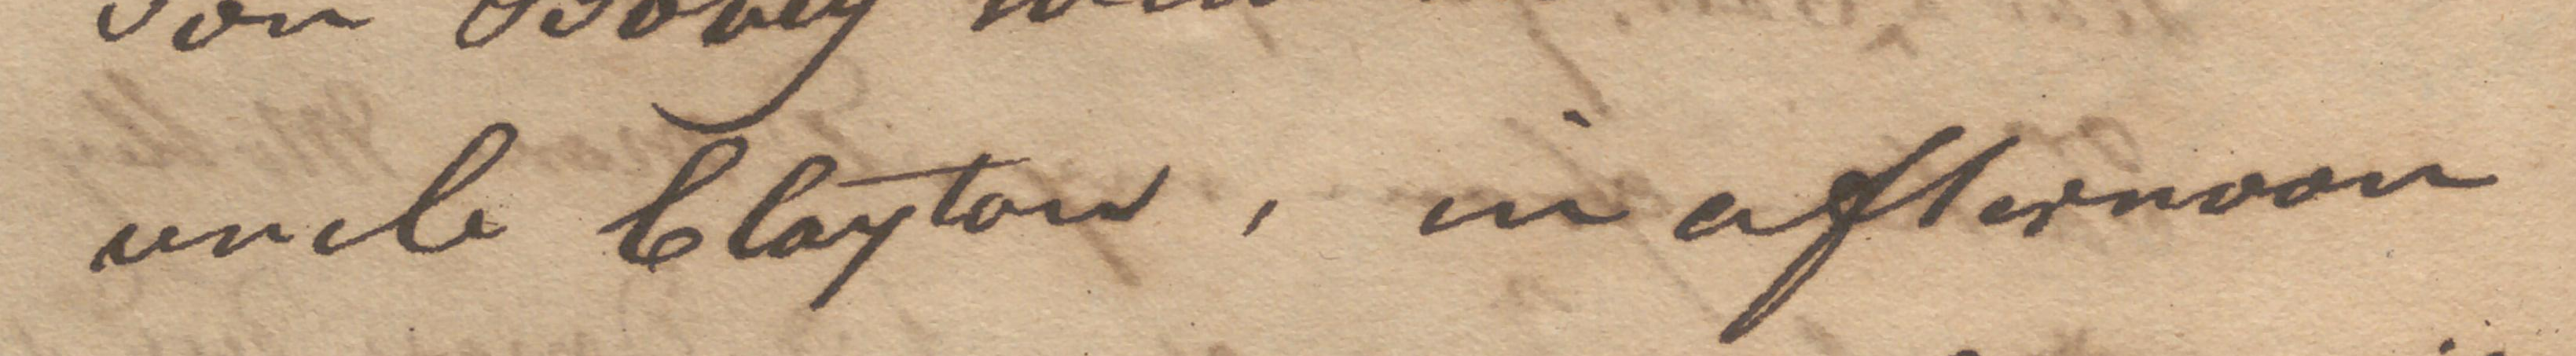unile Clayton, in afternoon
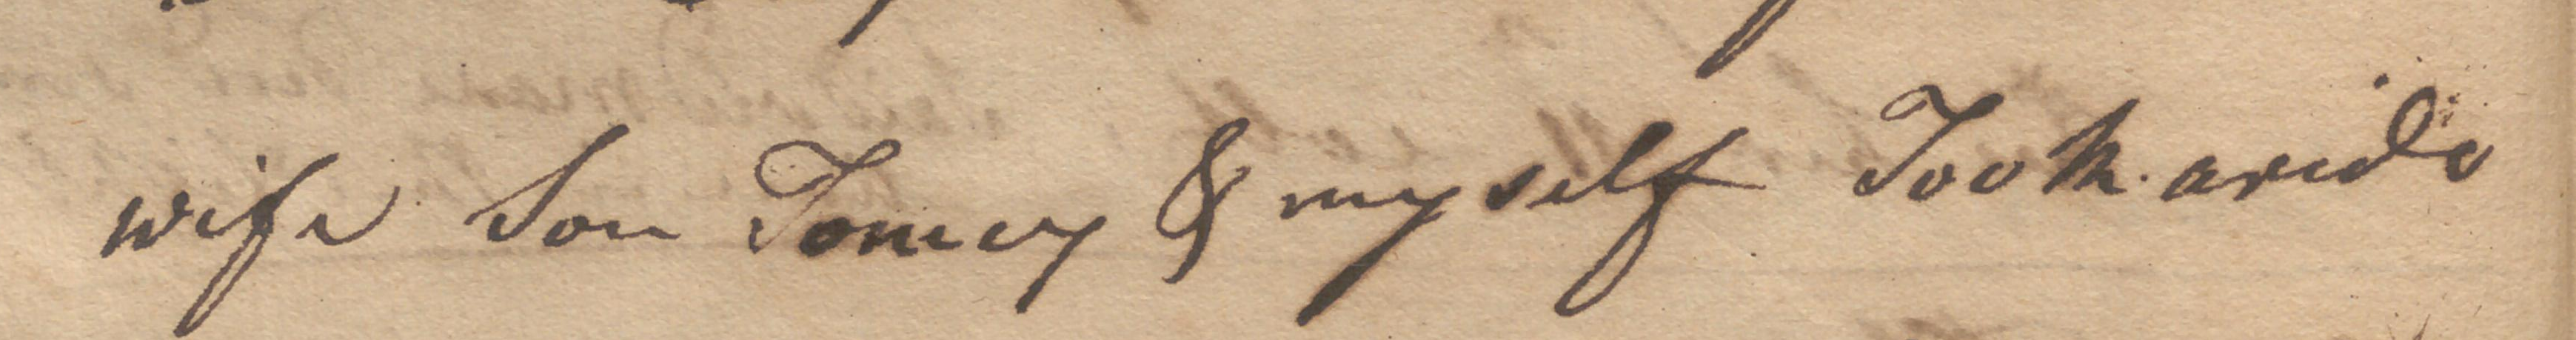wife Son Tomey & myself Took a ride
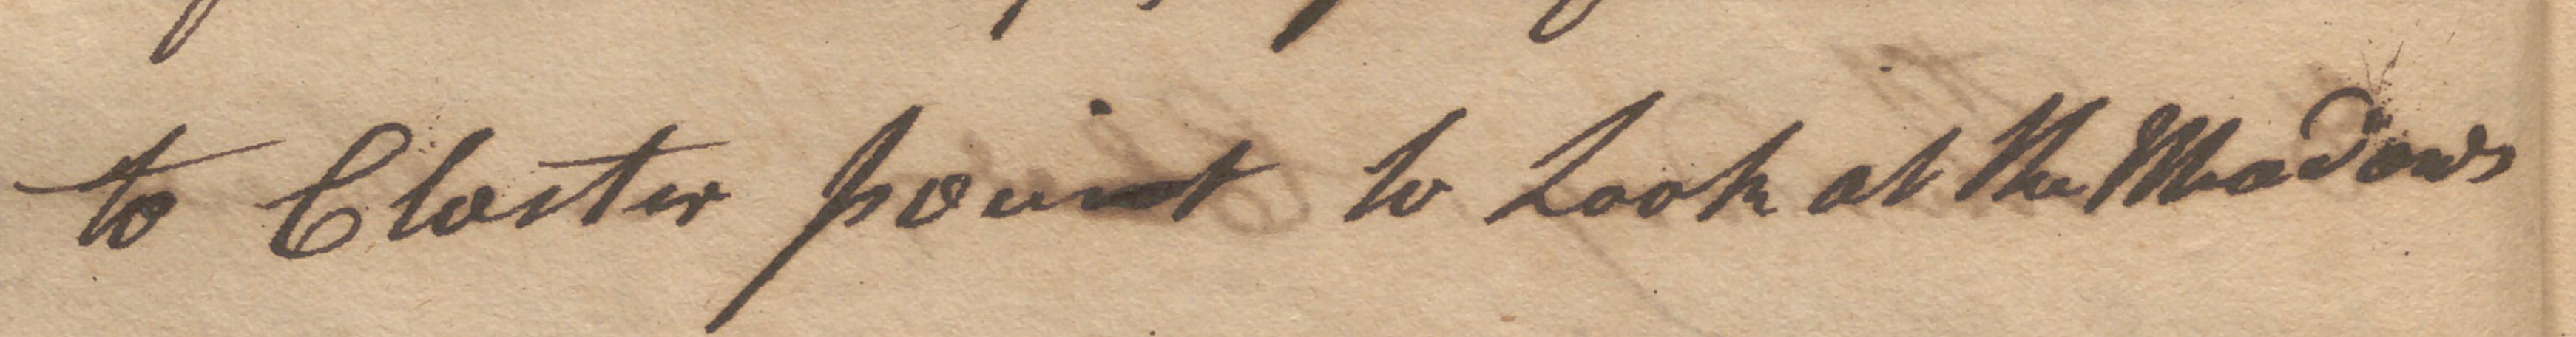to Closter point to Look at the Meadows
